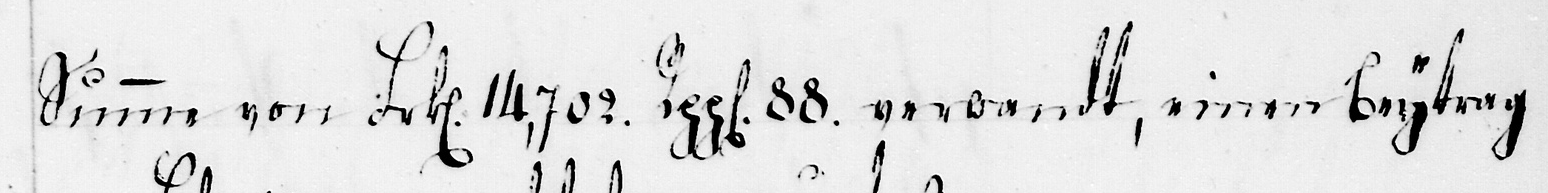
Summe von Frk[en]. 14,702. Rpp[en]. 88. verwandt, einen Beytrag
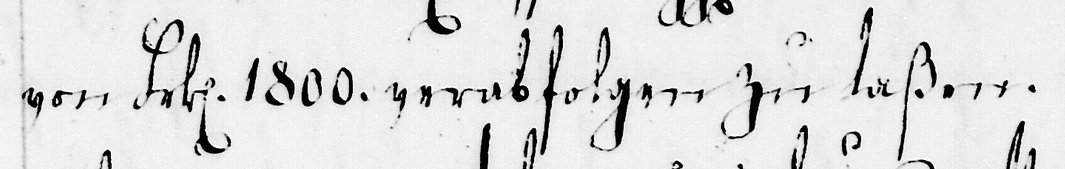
von Frk[en]. 1800. verabfolgen zu laßen.
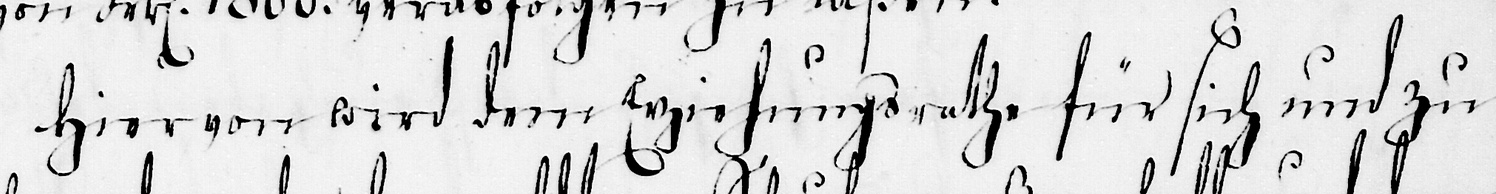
Hiervon wird dem Erziehungsrathe für sich und zu
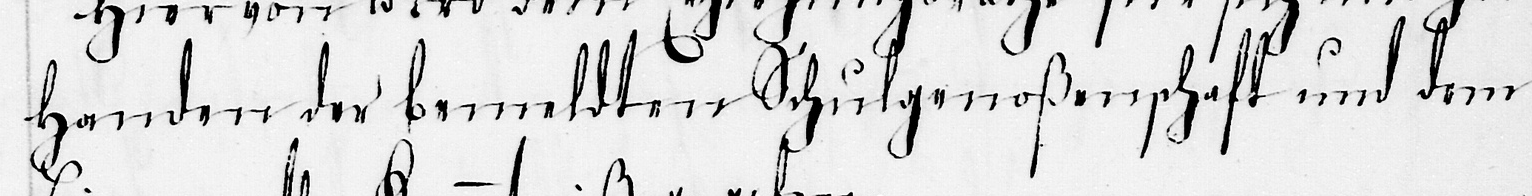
Handen der bemeldten Schulgenoßenschaft und dem
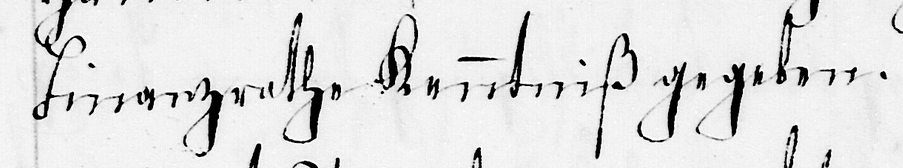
Finanzrathe Kenntniß gegeben.
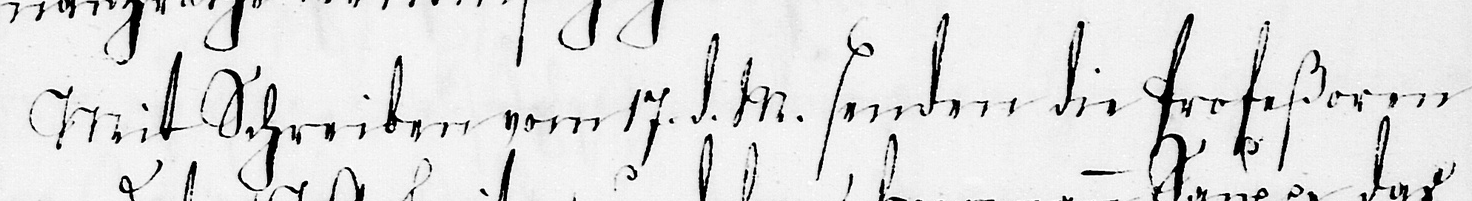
Mit Schreiben vom 17. d. M. senden die Profeßoren
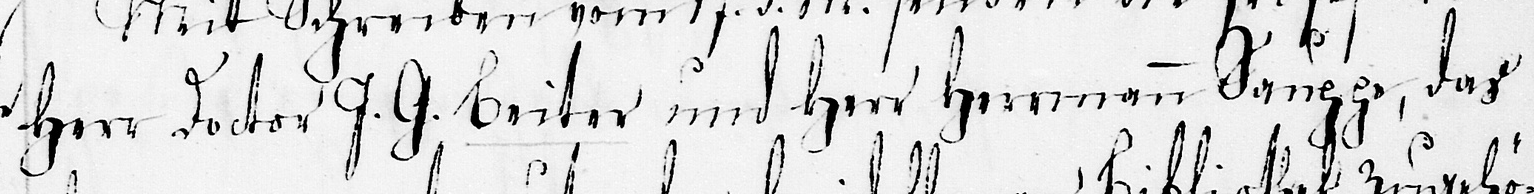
Herr Doctor J. G. Beiter und Herr Hermann Sauppe, das
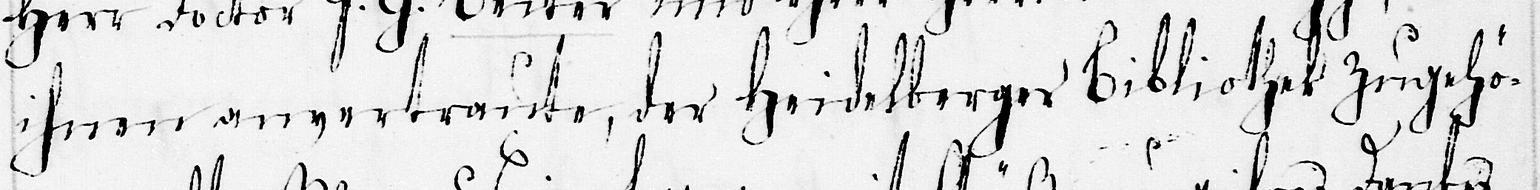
ihnen anvertraute, der Heidelberger Bibliothek zugehö¬
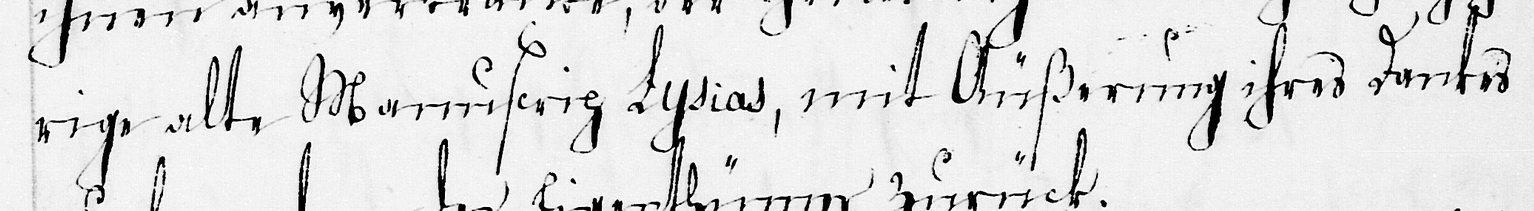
rige alte Manuscrip[t] Lysias, mit Äußerung ihres Dankes
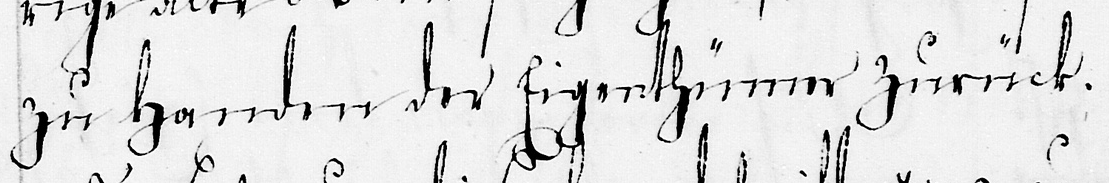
zu Handen der Eigenthümer zurück.
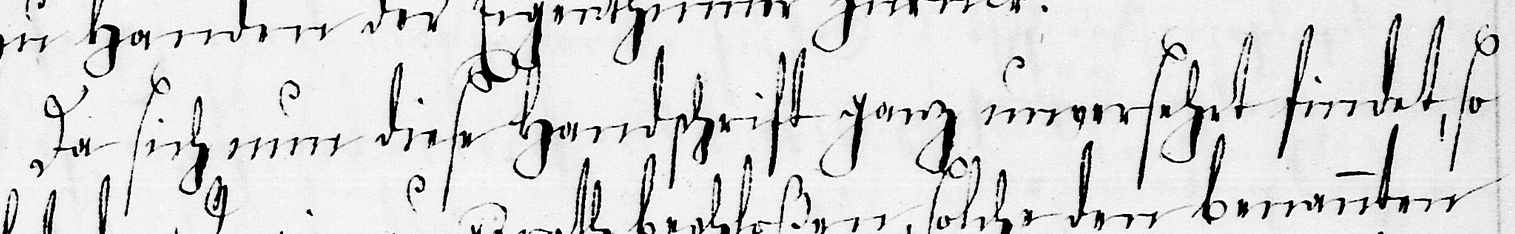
Da sich nun diese Handschrift ganz unversehrt findet, so
